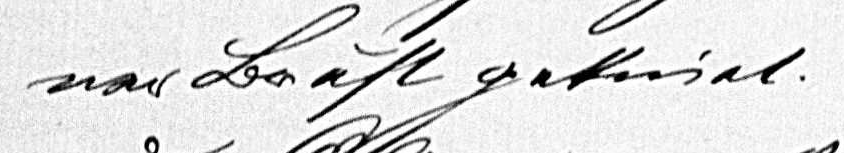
ner Brust gekniet.
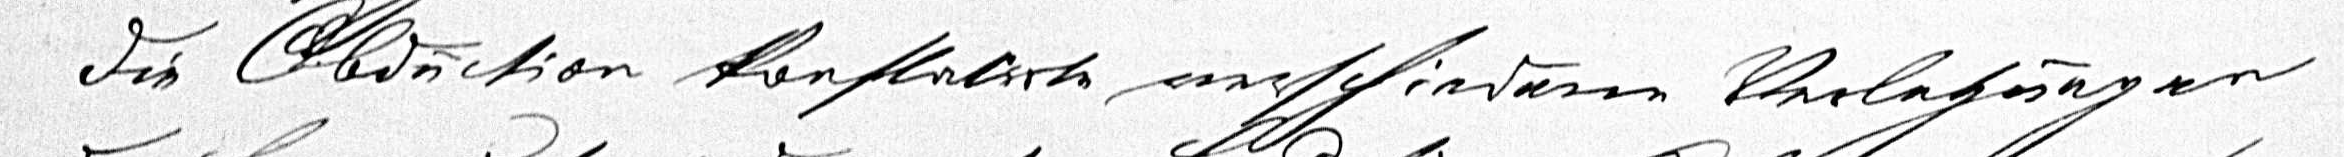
Die Obduction konstatirte verschiedene Verletzungen
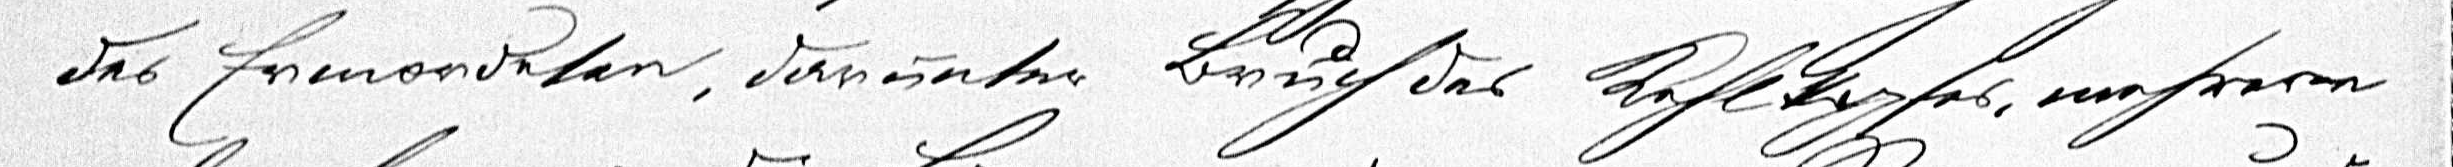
des Ermordeten, darunter Bruch des Kehlkopfes, mehrere
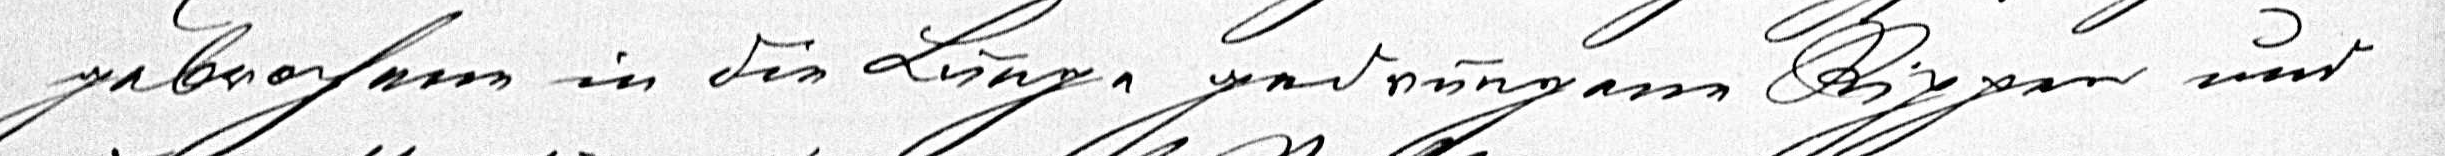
gebrochenen in die Lunge gedrungene Rippen und
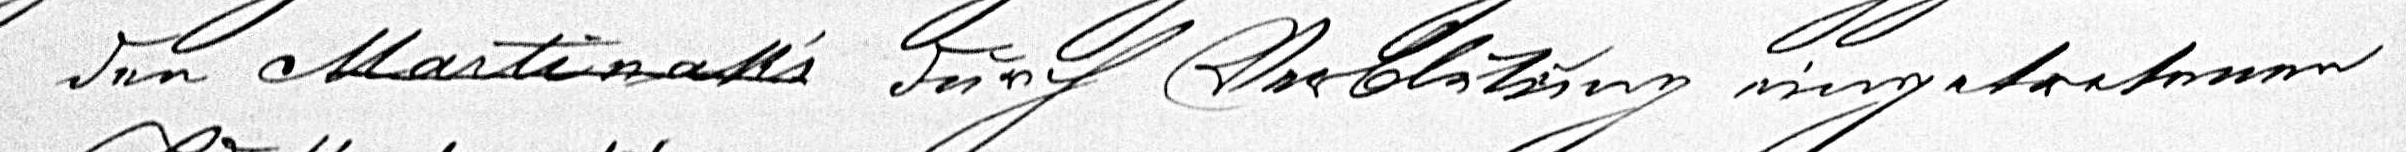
den durch Verblutung eingetretenen
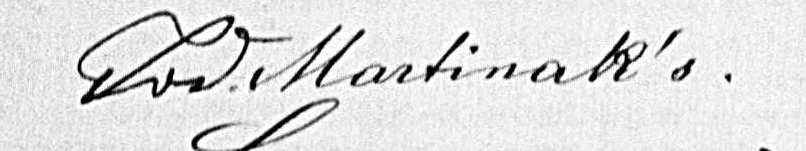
Tod Martinak’s.
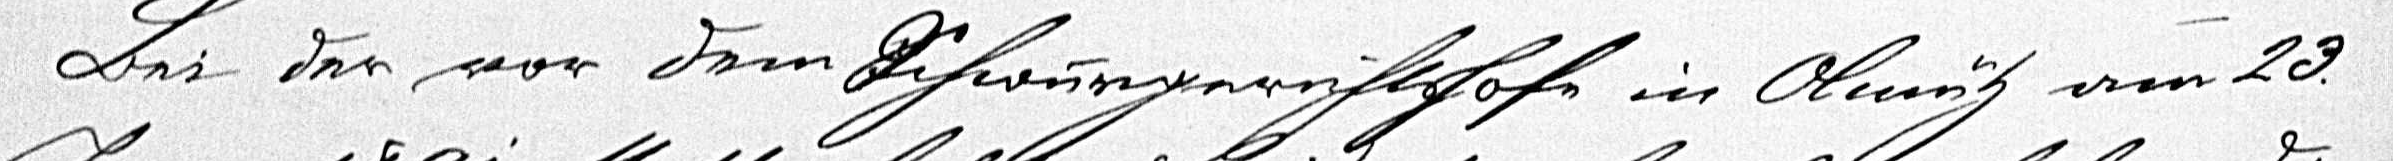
Bei der vor dem Schwurgerichtshofe in Olmütz am 23.
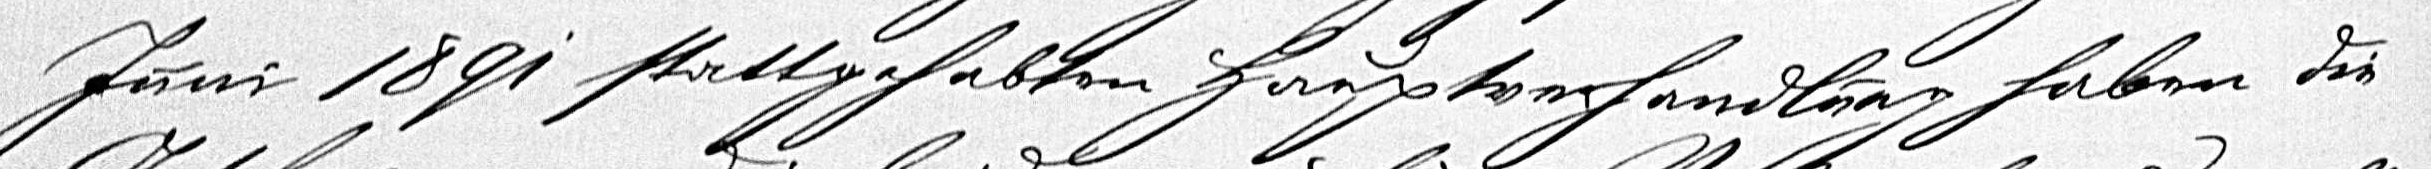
Juni 1891 stattgehabten Hauptverhandlung haben die
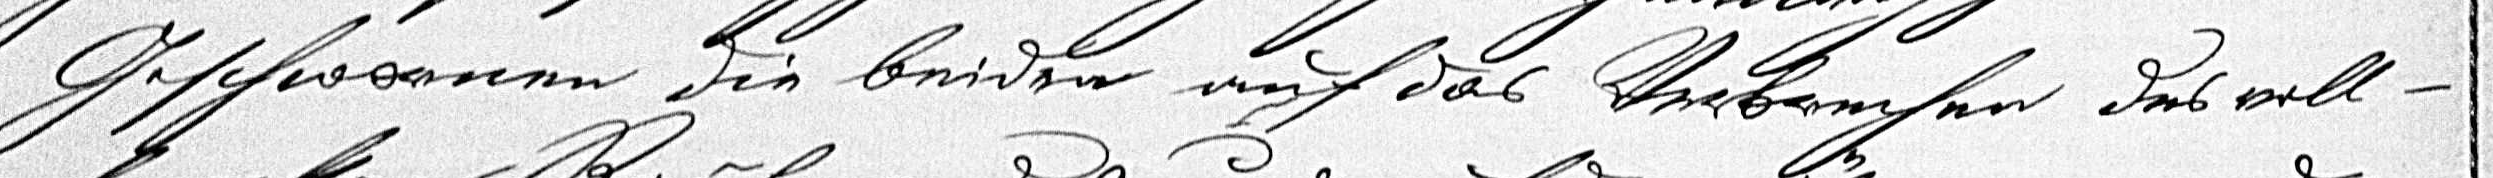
Geschworenen die beiden auf das Verbrechen des voll¬
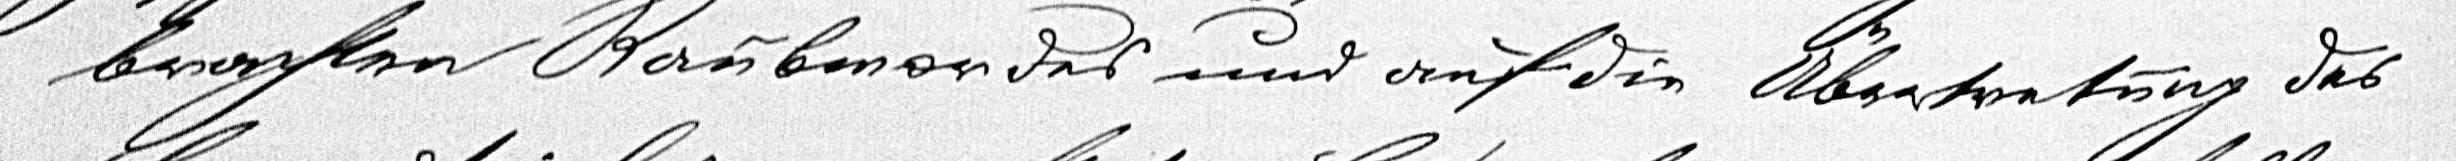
brachten Raubmordes und auf die Übertretung des
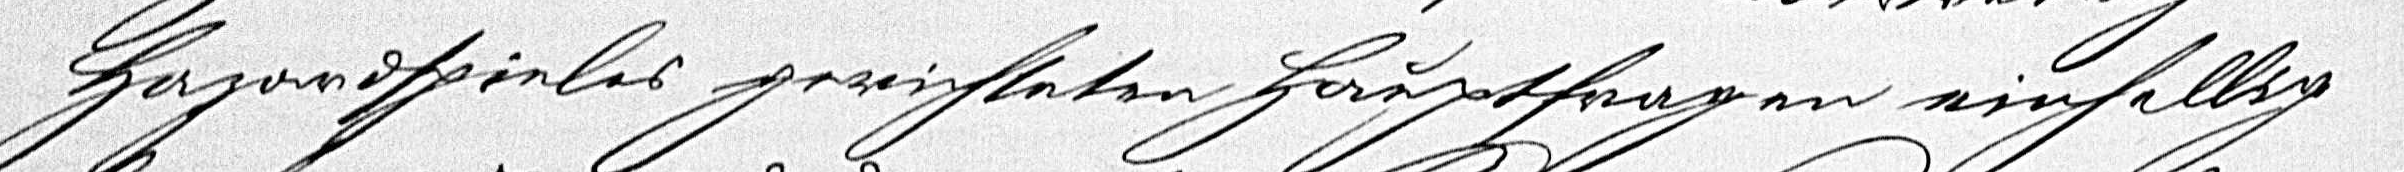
Hazardspieles gerichteten Hauptfragen einhellig
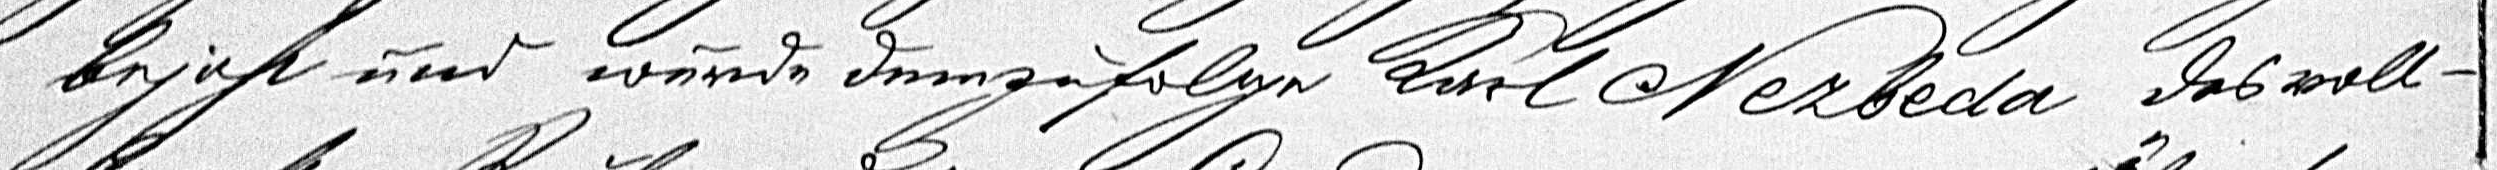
bejaht und wurde demzufolge Karl Nezbeda des voll¬
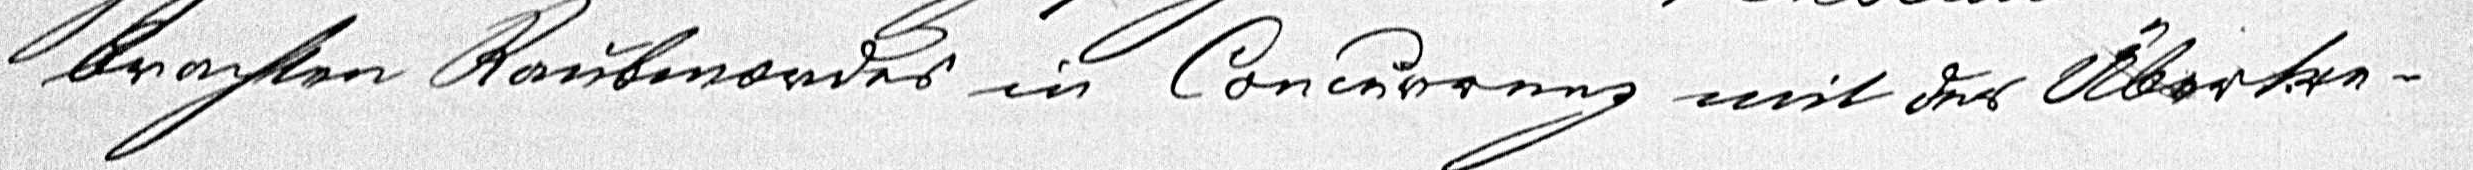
brachten Raubmordes in Concurrenz mit der Übertre¬
